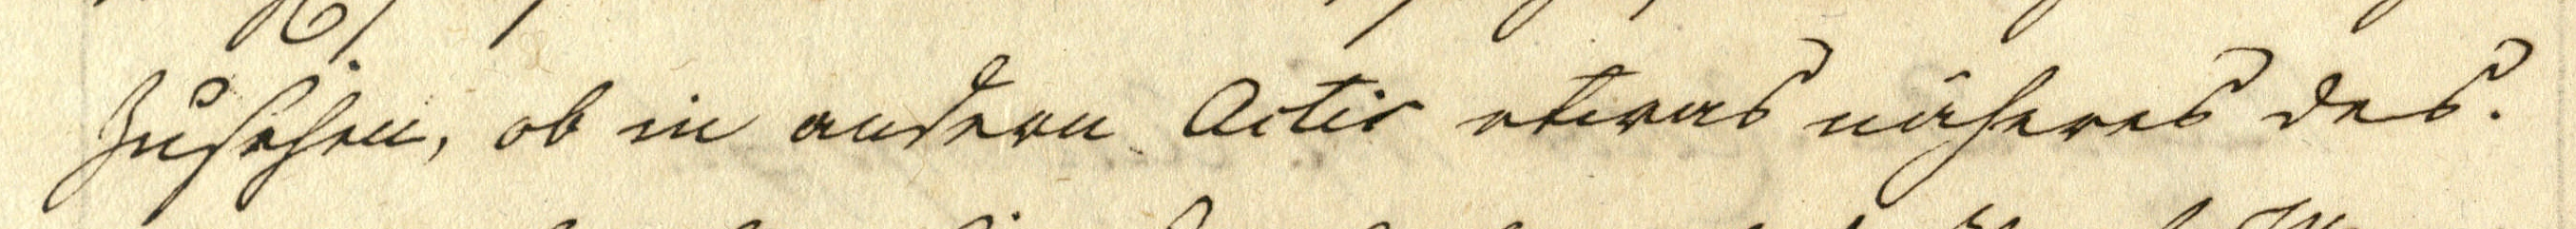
zusehen, ob in andern Actis etwas näheres des-
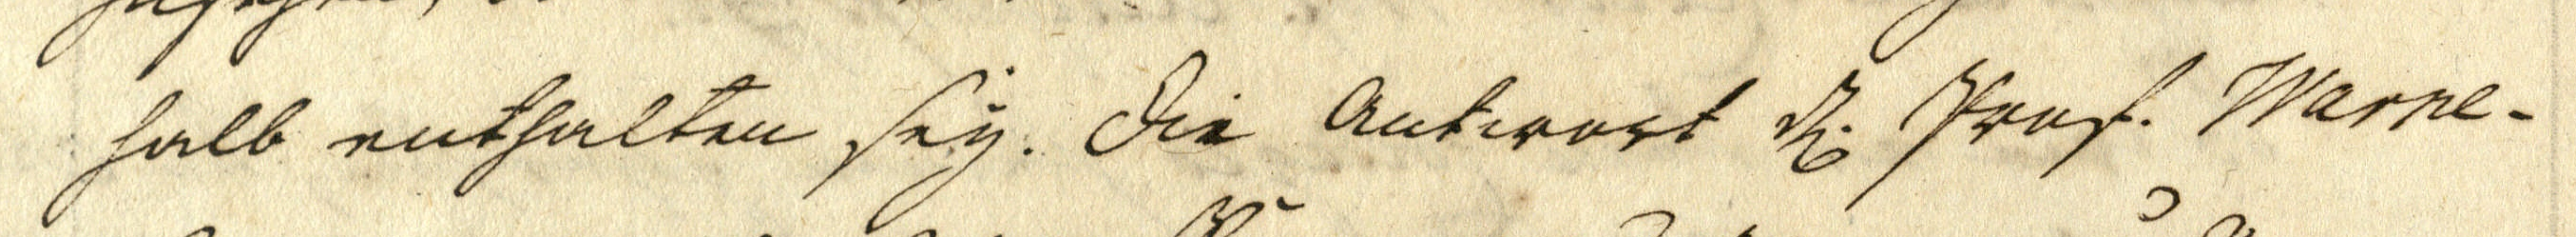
halb enthalten sey. Die Antwort d. Prof. Warne-
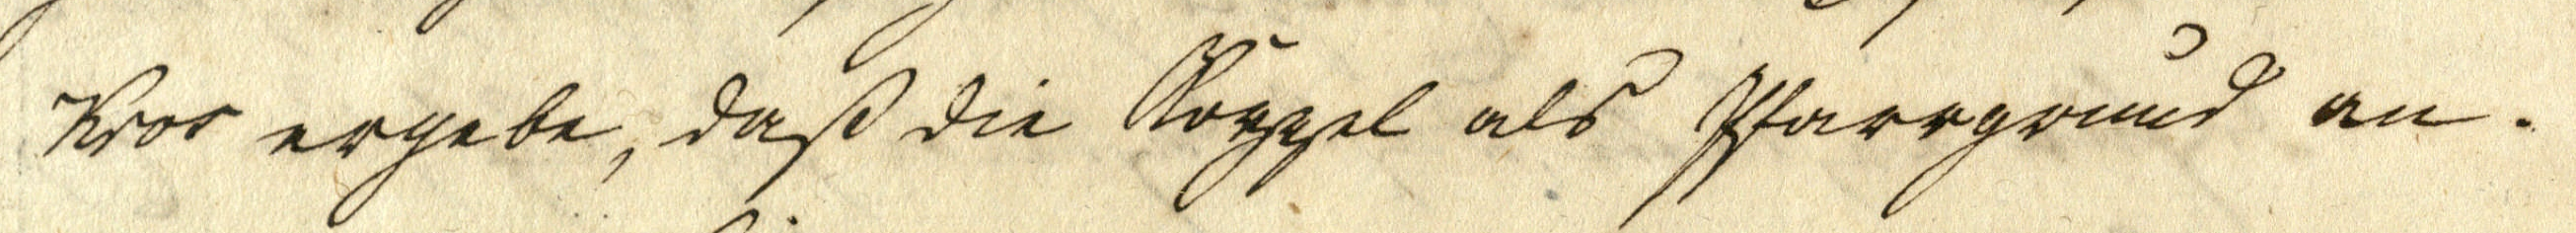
kros ergeben, daß die Koppel als Pfarrgrund an-
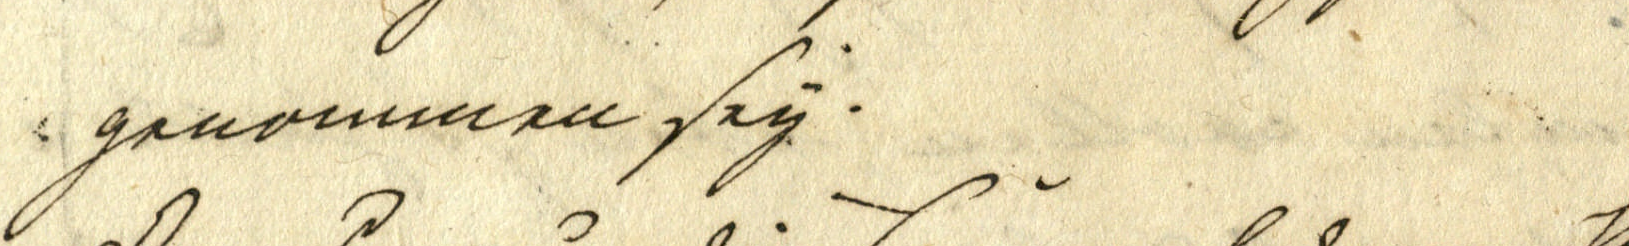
genommen sey.
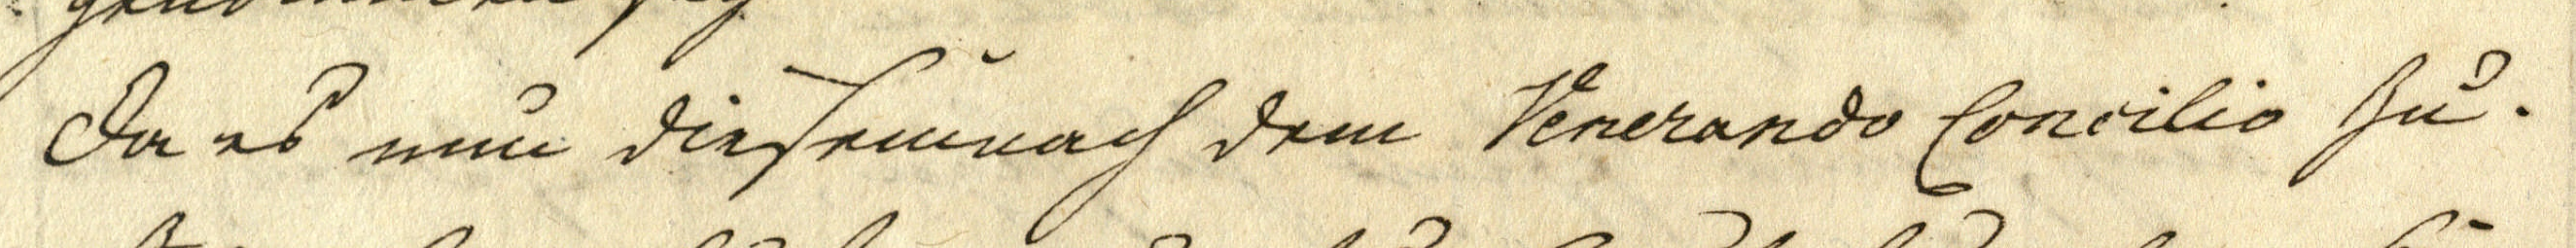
Da es nun diesemnach dem Venerando Concilio zu-
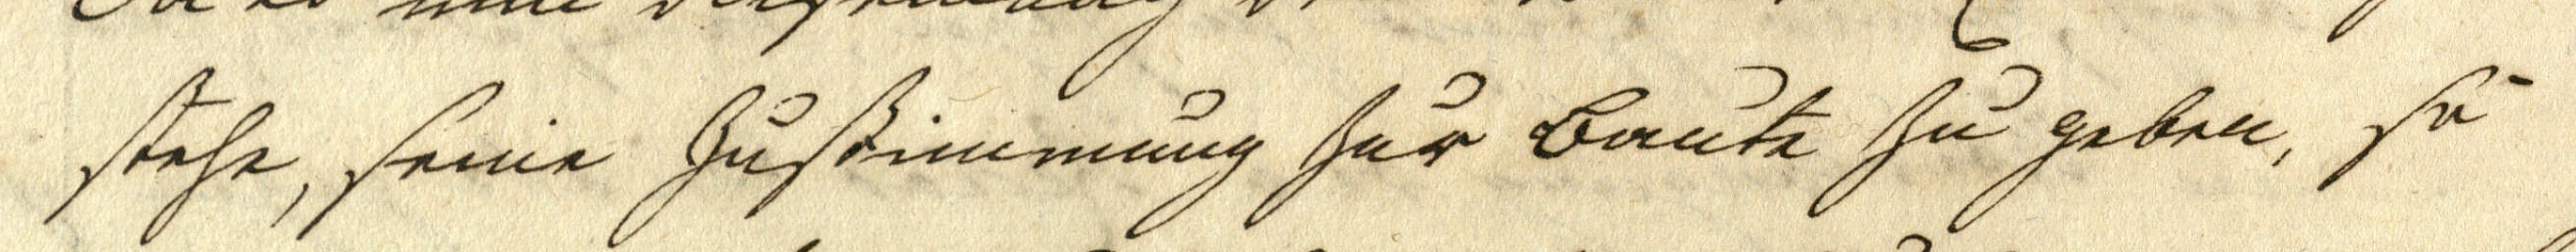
stehe, seine Zustimmung zur Baute zu geben, so
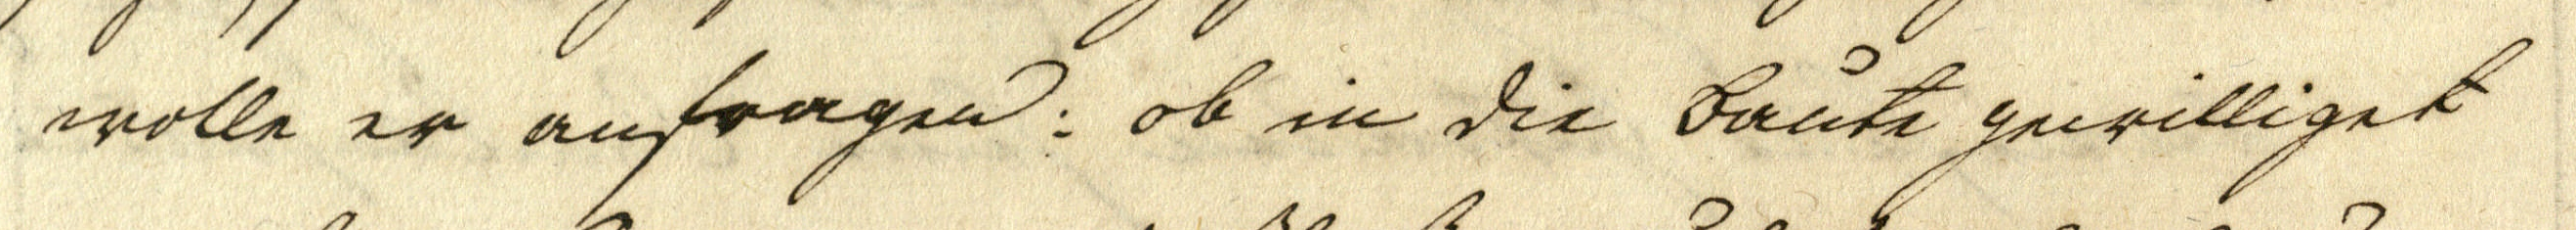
woller er anfragen: ob in die Baute gewilliget
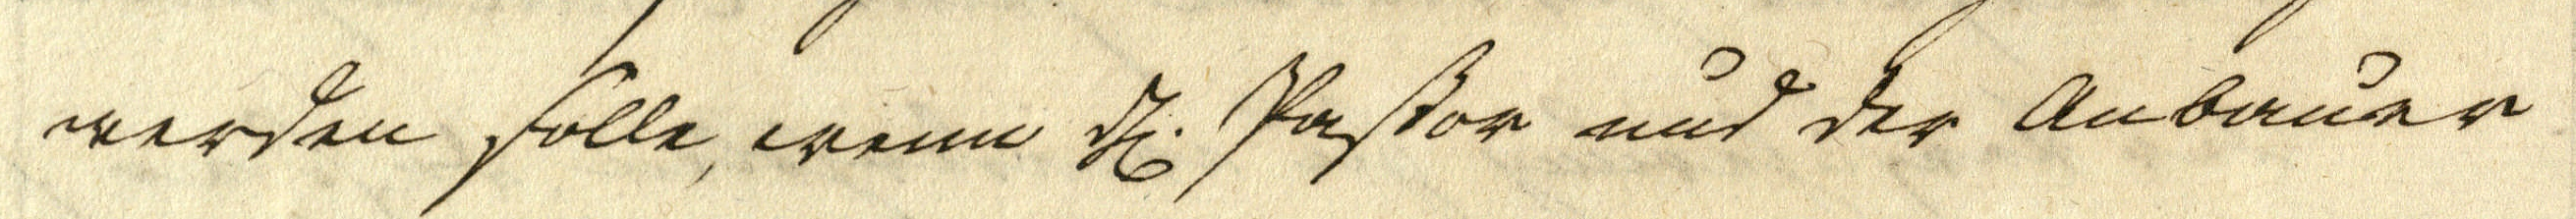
werden solle, wenn dh. Pastor und der Anbauer
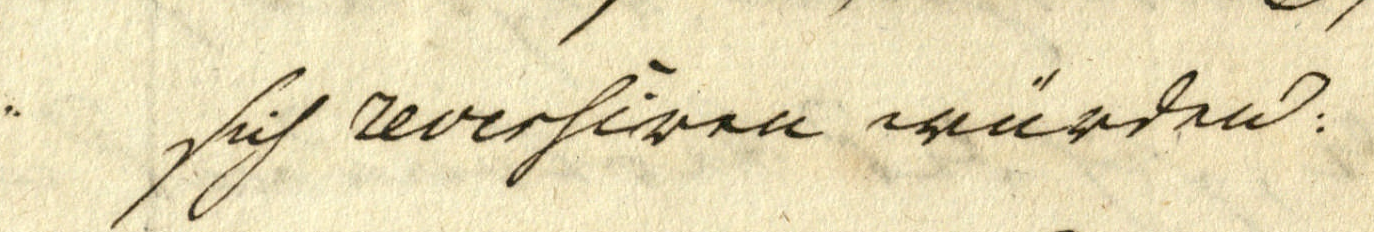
sich reversiren würden:
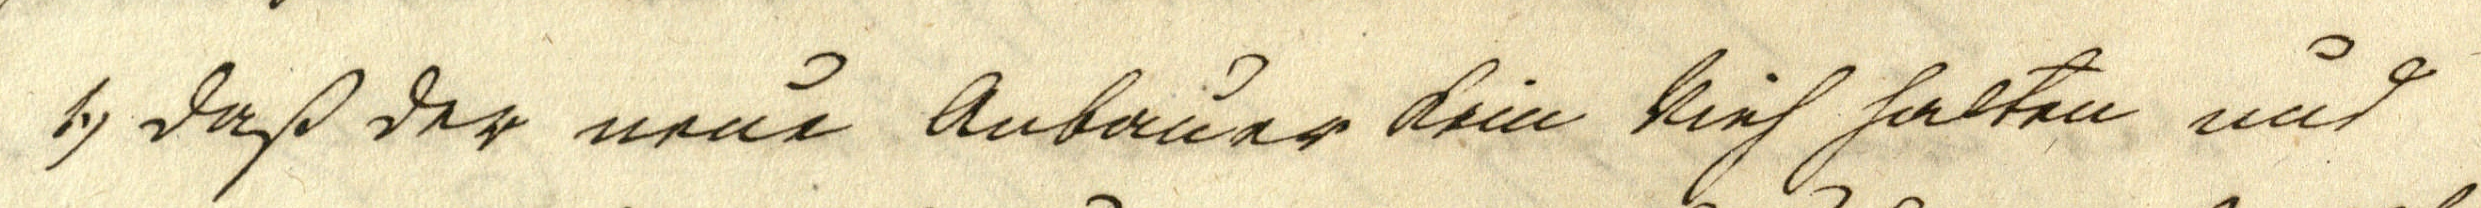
1.) daß der neue Anbauer kein Vieh halten und
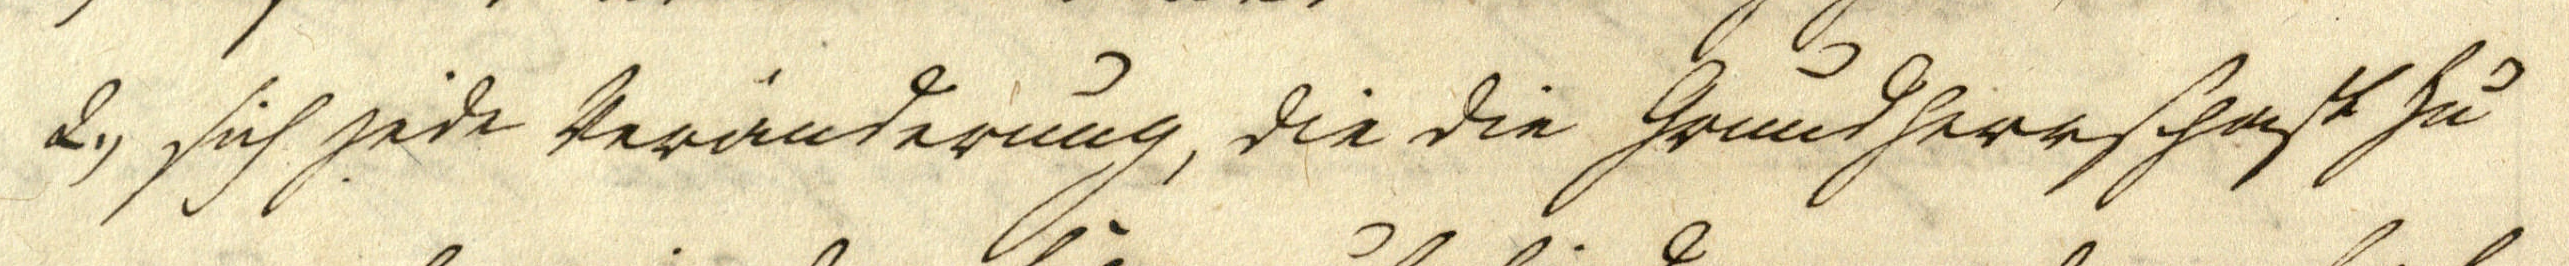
2.) sich jede Veränderung, die die Grundherrschaft zu
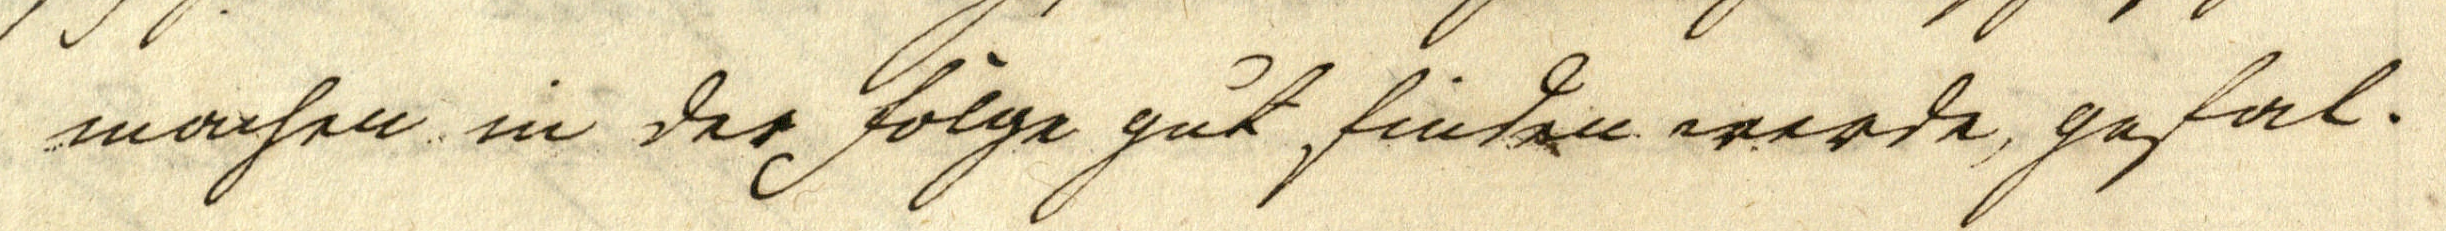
machen in der Folge gut finden werde gefal-
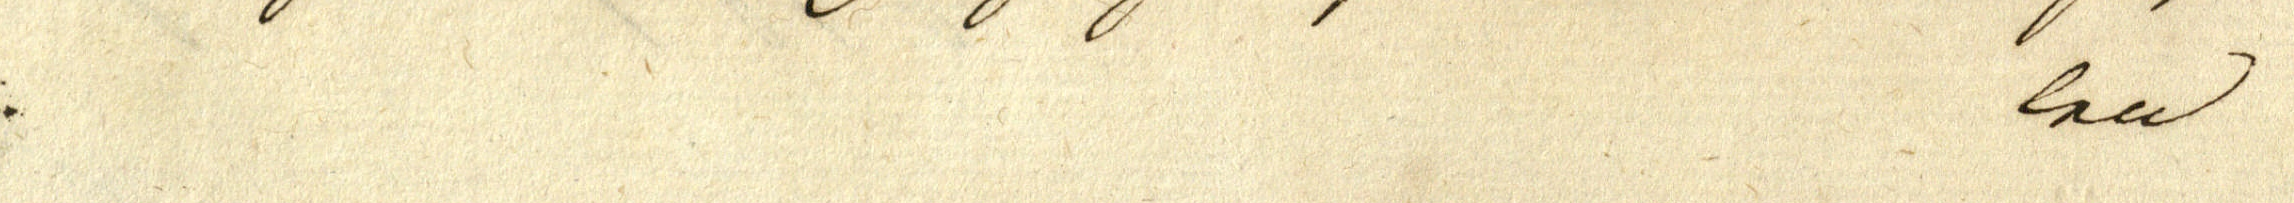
len
